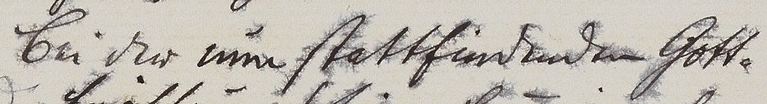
Bei der nun stattfindenden Gott-
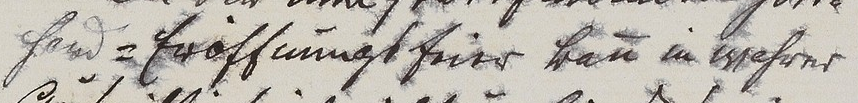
hard-Eröffnungsfeier kann in wahrer
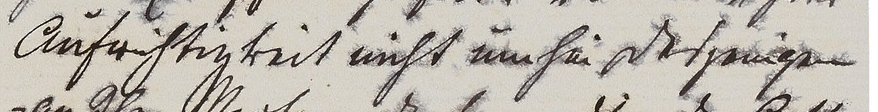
Aufrichtigkeit nicht umhin desjenigen
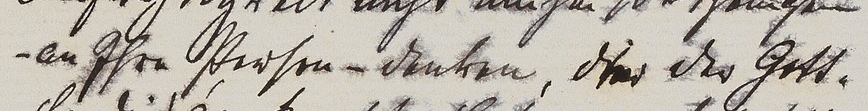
– an Ihre Person – denken, die der Gott-
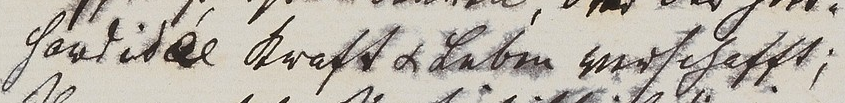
hardidée Kraft & Leben verschafft;
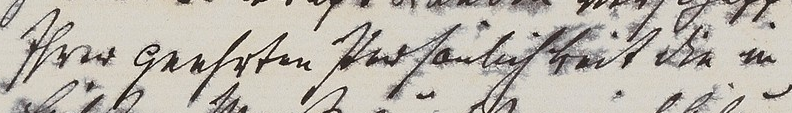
Ihrer geehrten Persönlichkeit die in
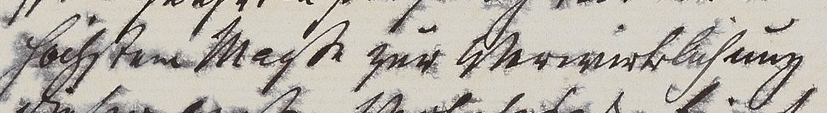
höchstem Maße zur Verwirklichung
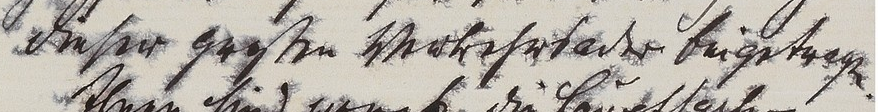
dieser großen Verkehrsader beigetragen.
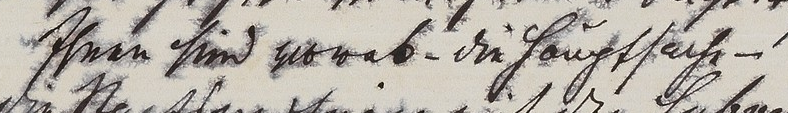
Ihnen sind vorab – die Hauptsache –
